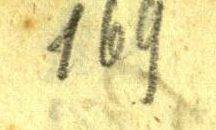169
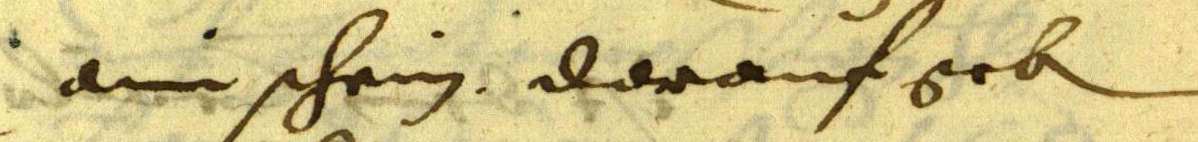ain schein. daraūf geb
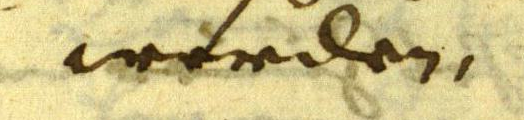werden,
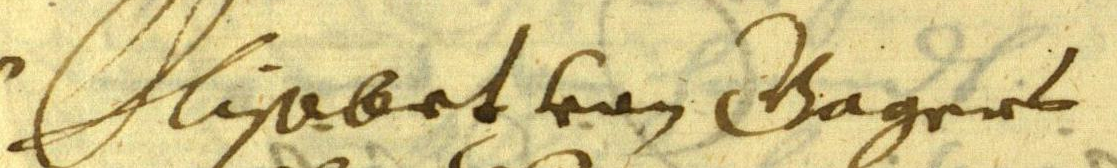Elisabet von Gagers
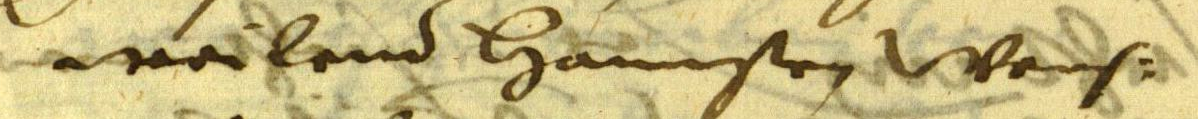weilend Hannsen Wens¬
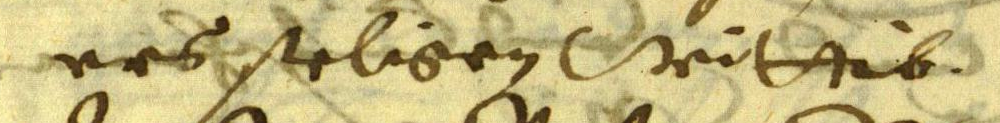ers seligen Wittib.
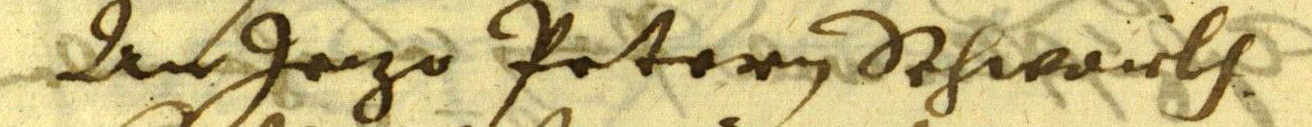An Jezo Petern Schwaickh¬
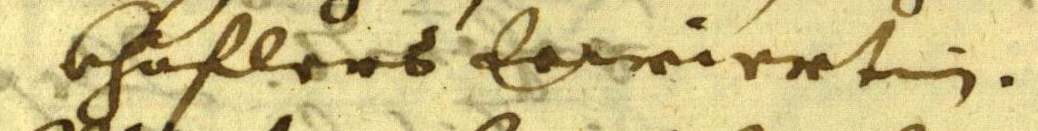khoflers Eewiertin.
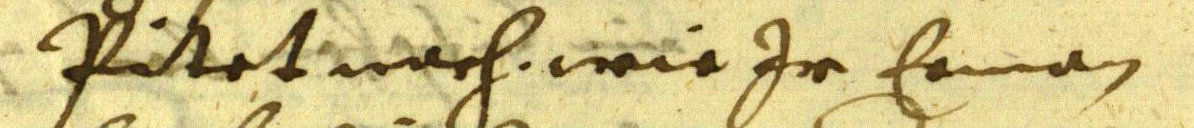Pitet noch. wie Ir Eeman
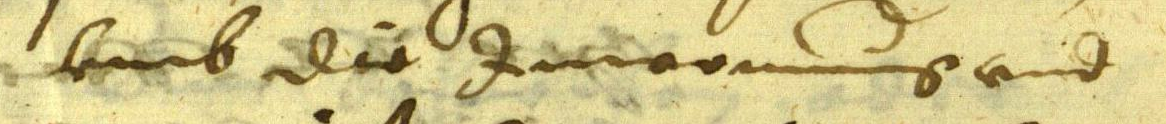vmb die Inwonūng vnd
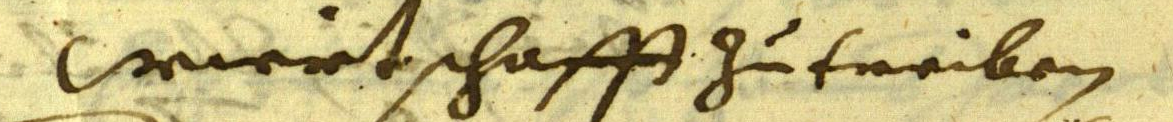wiertschafft Zū treiben
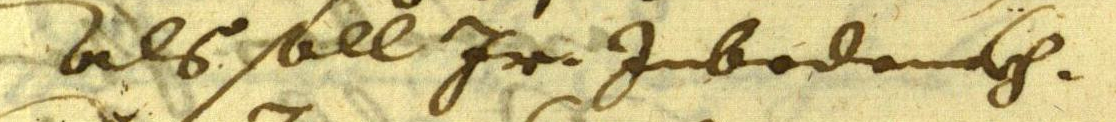Als soll Ir Inbedenckh¬
